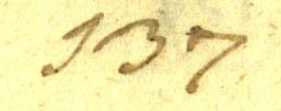137
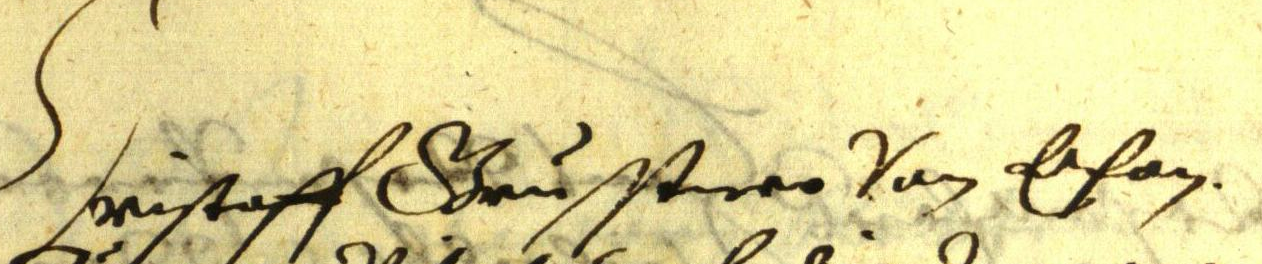Cristoff Grūsstner Von Epan.
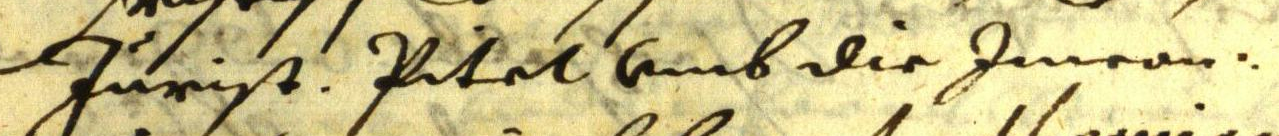Jūrist. Pitet vmd die Inwon¬
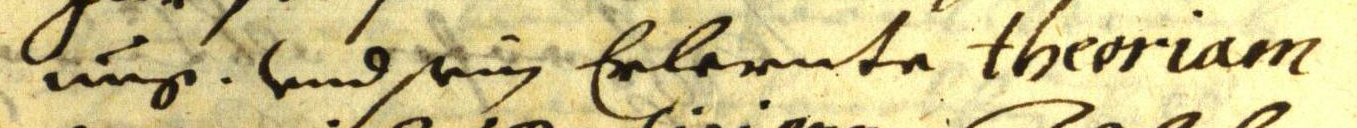ūng. vnd sein Erlernte theoriam
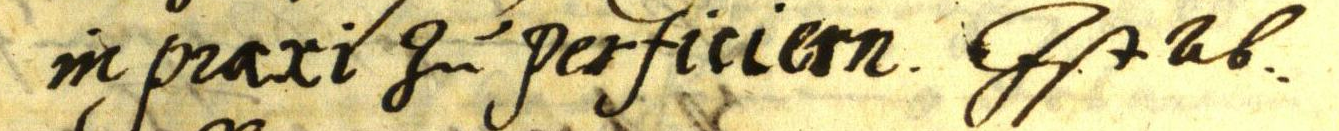in praxi Zū perficiern. Ist Ab¬
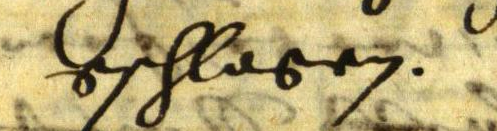gschlagen.
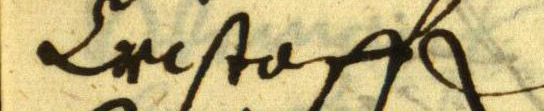Cristoff
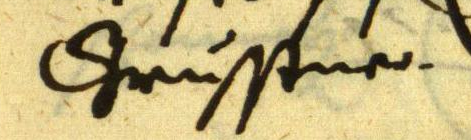Grūsstner.
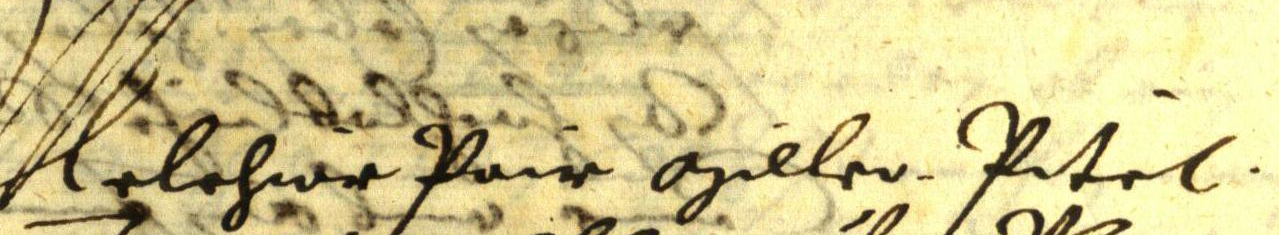Melchior Pair Miller. Pitet
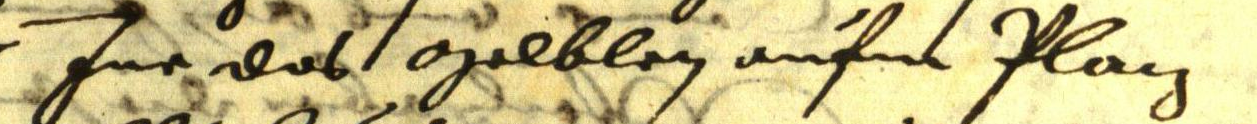Ine das Melblen aūfm Plaz
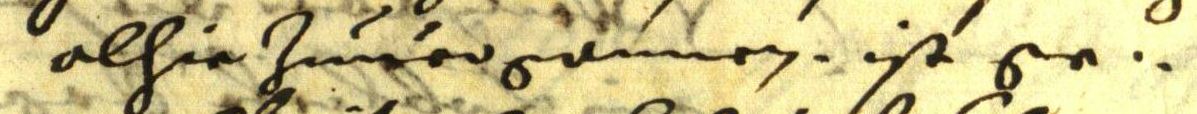alhie Zūūergonnen. ist ge¬
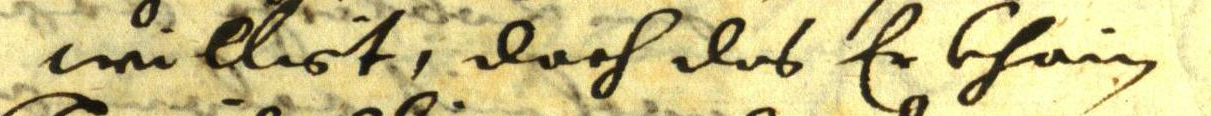willigt, doch das Er khain
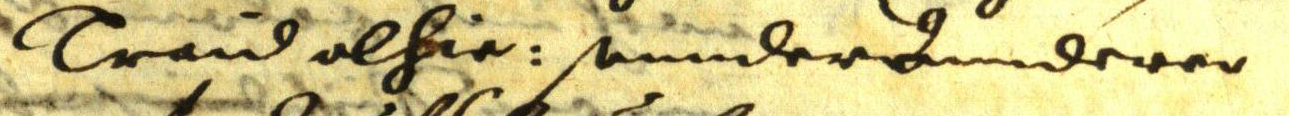Traid alhie: sonnder Annderer
